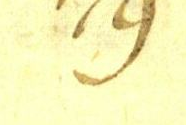79
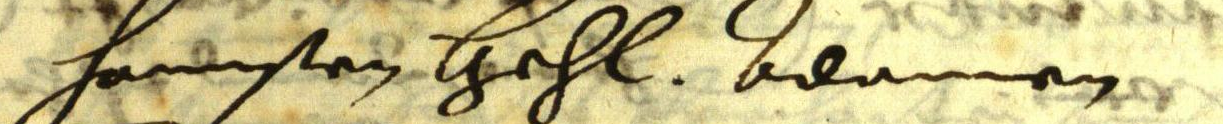hansen Hehl. Adamen
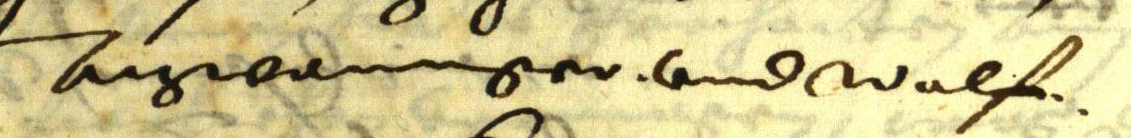Azwannger. vnd Wolf-
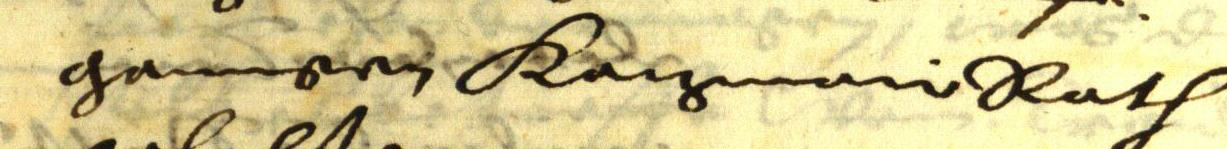ganngen Kazmair Rath
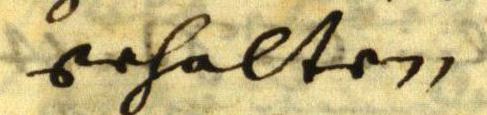gehalten,
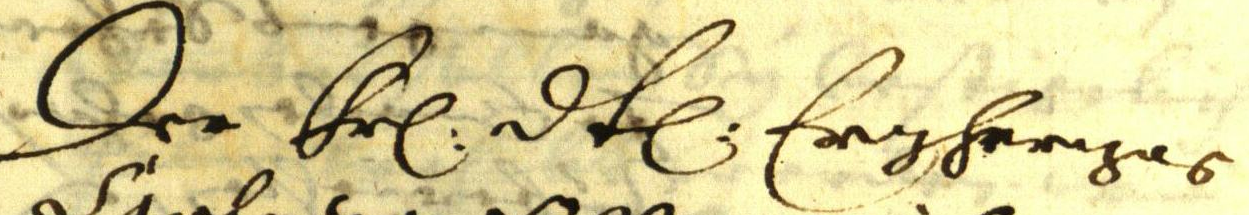Der Frl: Dt: Erzherzog
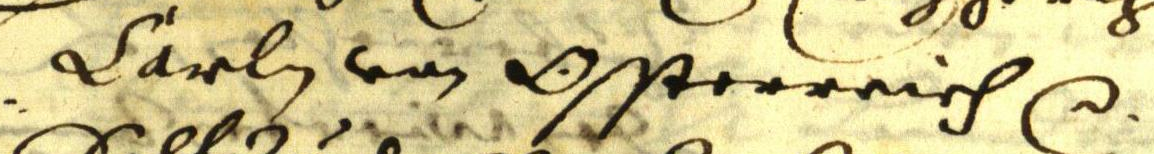Carln von Ossterreich etc.
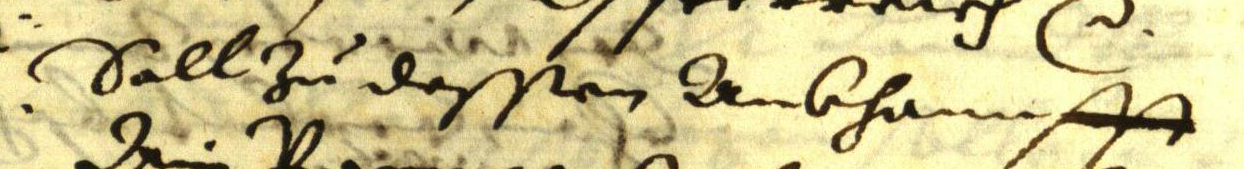Soll Zū dessen Ankhonnfft
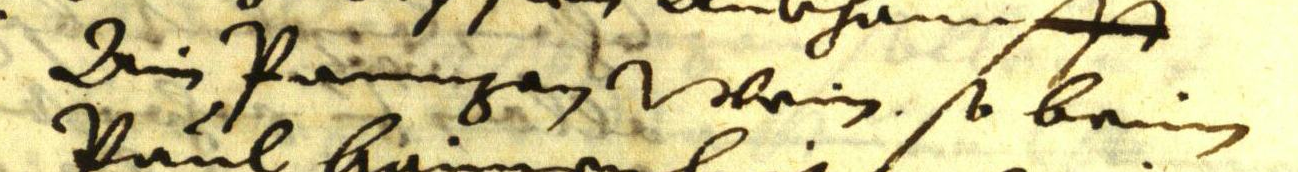Ain Pannzen Wein. so beim
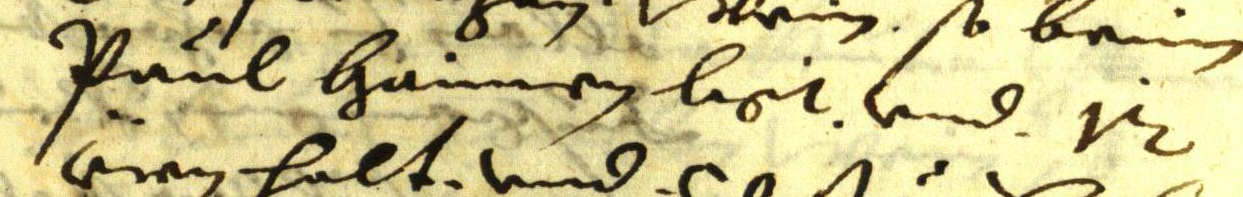Paūl Haimen ligt. vnd 12
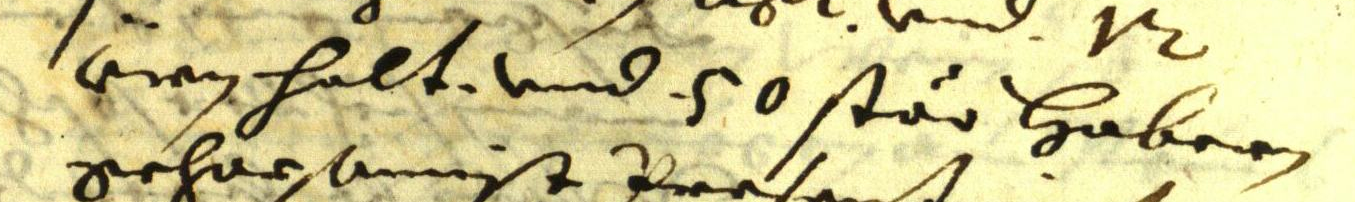vrn halt. vnd .50 stār Habern
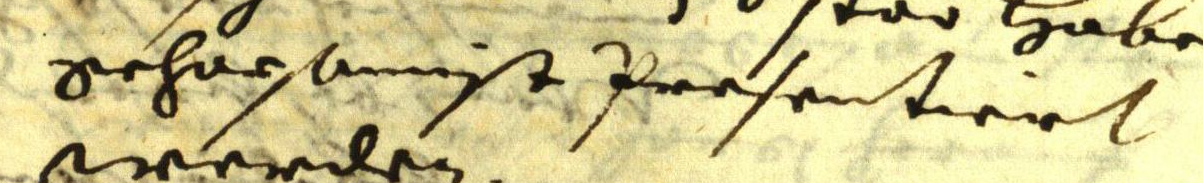gehorsamist Presentiert
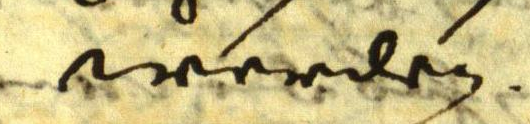werden.
